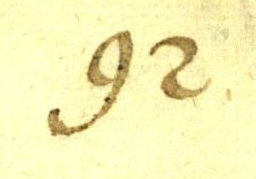92
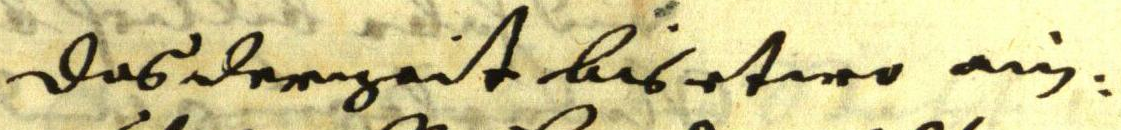das derzeit bis etwa ain:
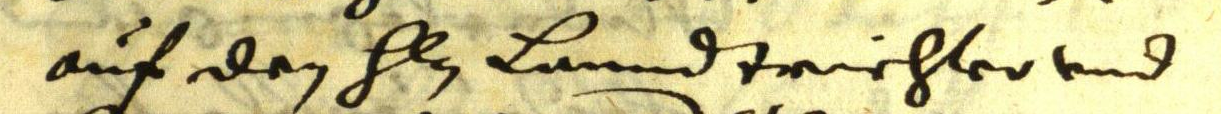aūf den hln Lanndtrichter vnd
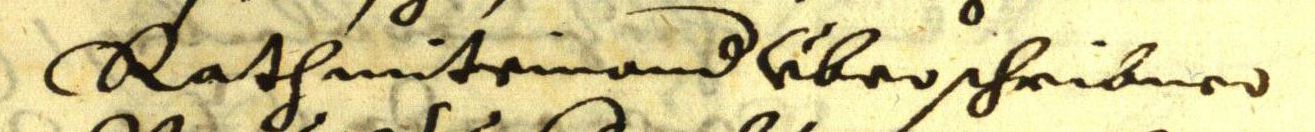Rath miteinand v̄berschribner
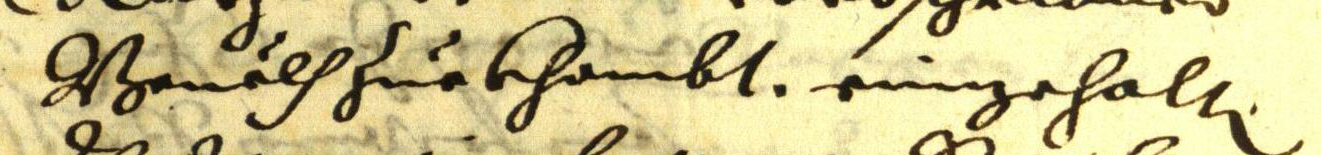Beūelh Zūe khombt. einzehalt.
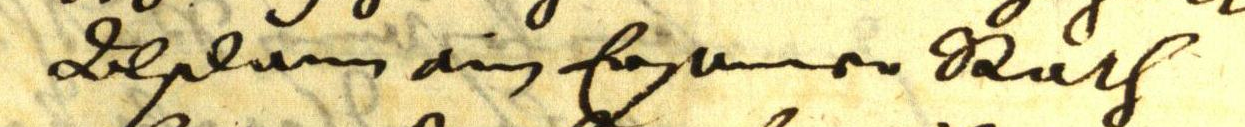Alsdann ain Ersamer Rath
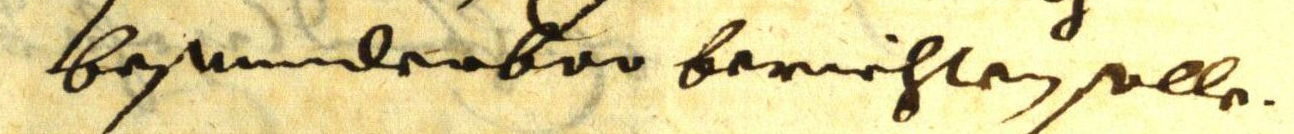besonnderbar berichten solle.
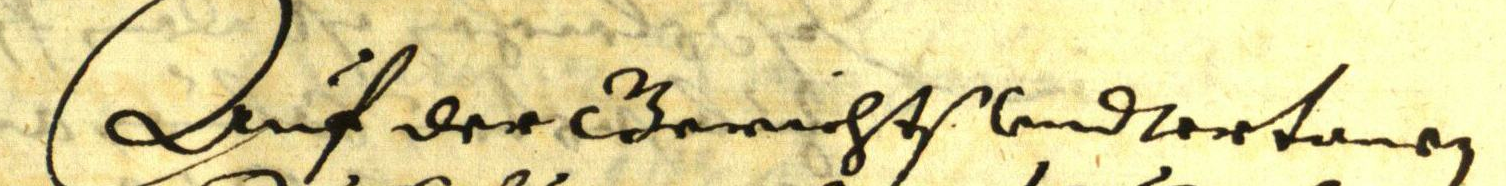Aūf der Gerichts vndtertanen
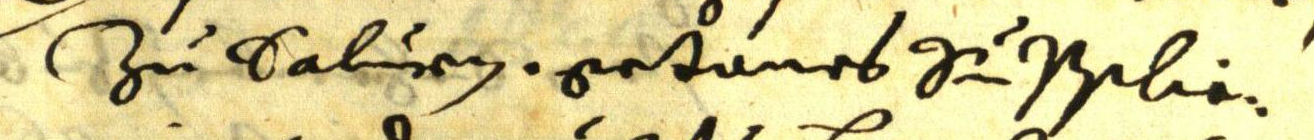Zū Salūrn. getanes SūPplic¬
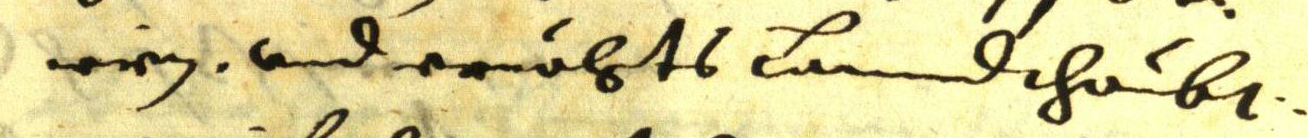iern. vnd ervolgts Lanndthaūbt¬
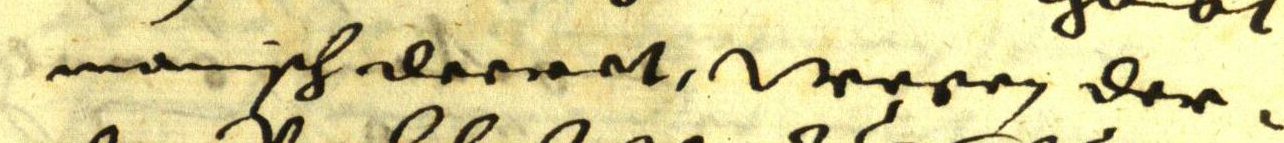manisch decret, Wegen der
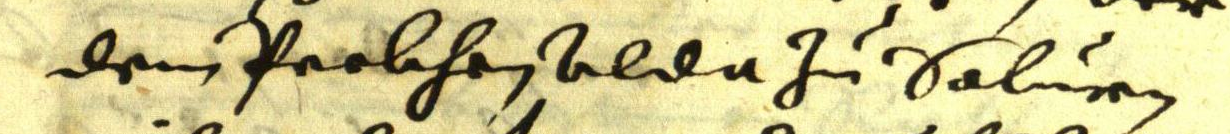dem Peckhen Alda Zū Salūrn
